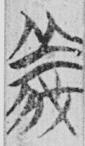義
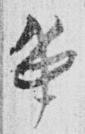身
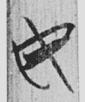母
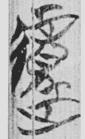○（動）
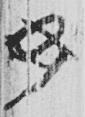𡚦（焉）
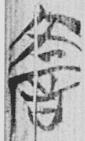○（顔）
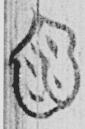囦（淵）
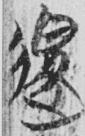退
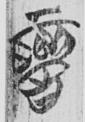○（數）
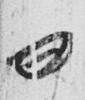日
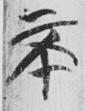不
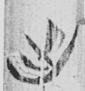出
